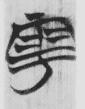𩁹
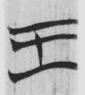王
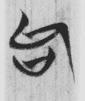句
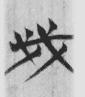{戈戈}
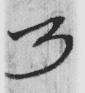乃
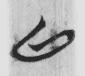㠯（以）
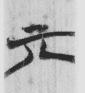亓
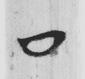厶
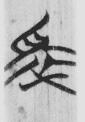卒B
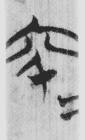{六千}=
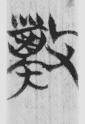○（竊）
